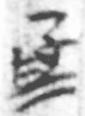爲
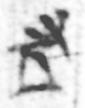○（右）
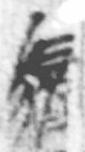○（服）
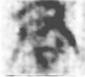君
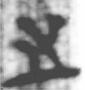之
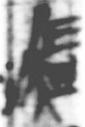騏
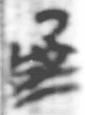爲
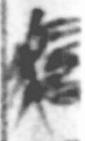驂
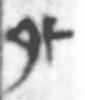外
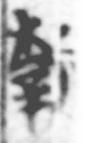新（新）
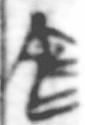官
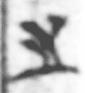之
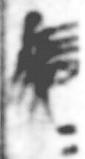駟
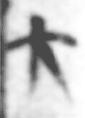大
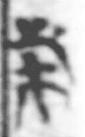旆
